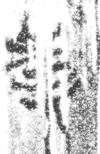尃（博）
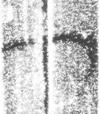一
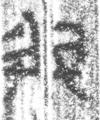灷（寸）
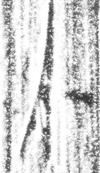少
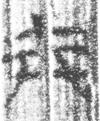灷（寸）
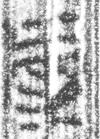厚
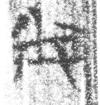灷（寸）
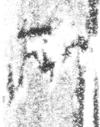一
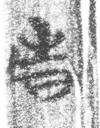青
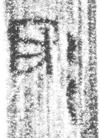緅
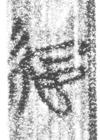○（纓）
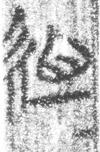組
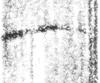一
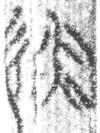緂
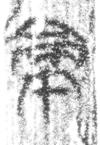常（裳）
